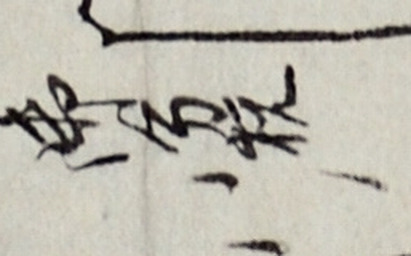御分杭
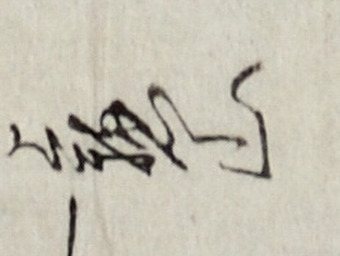上穂山
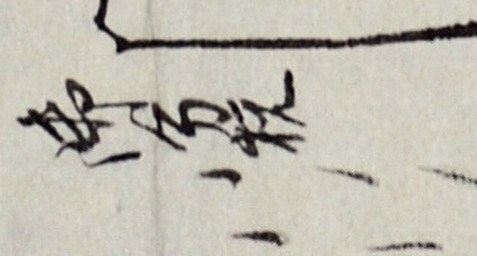御分杭
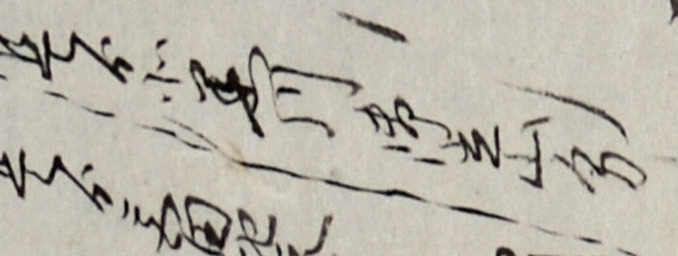是ゟ北黒川御立山分
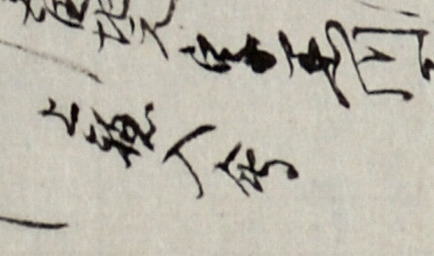上穂入会
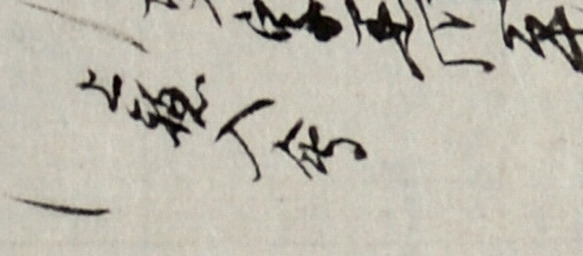上穂入会
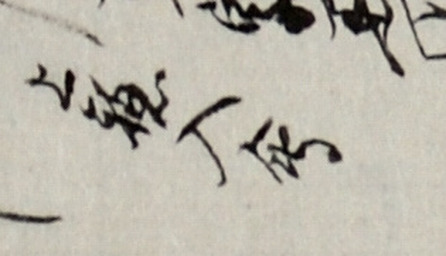上穂入会
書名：赤穂宮田山論裁許状
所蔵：伊那市立高遠町図書館・合同会社AMANE
